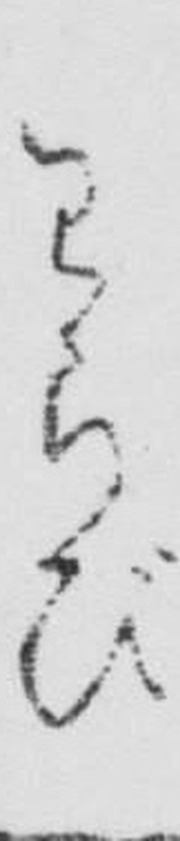わさび
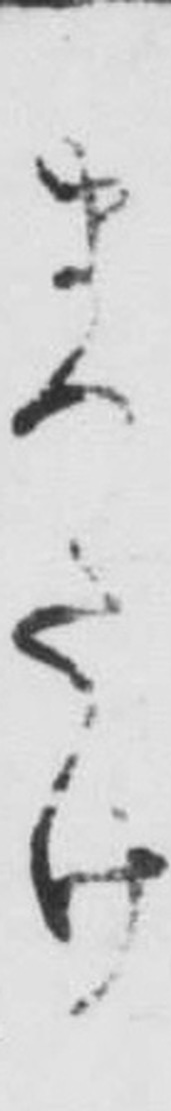まつたけ
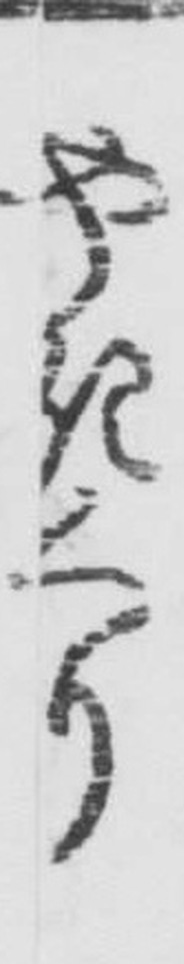やきくり
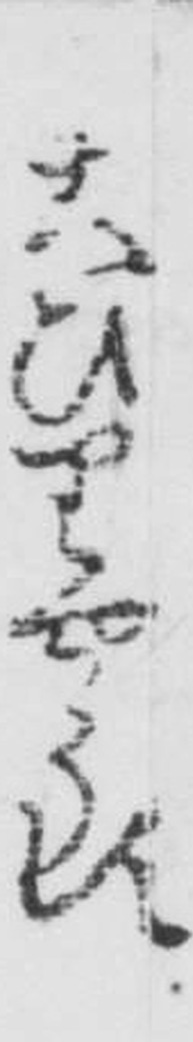大ひりやうす
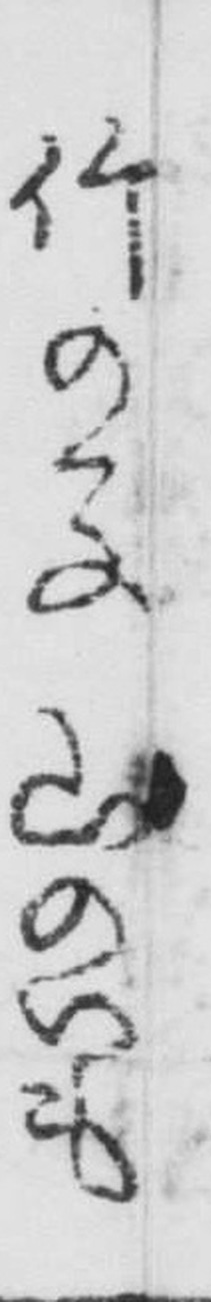竹の子山のいも
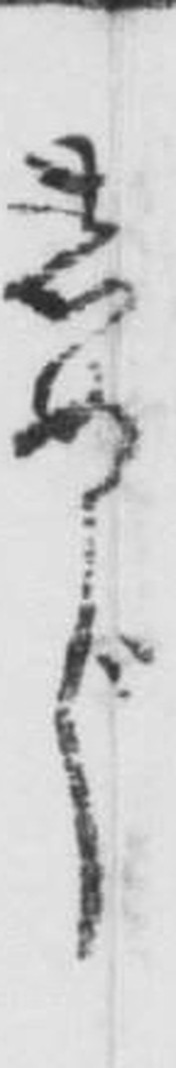しめじ
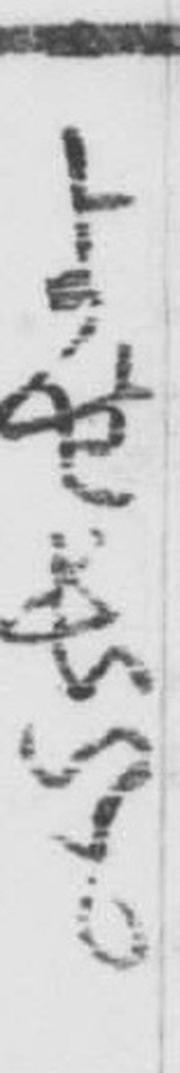よせ長いも
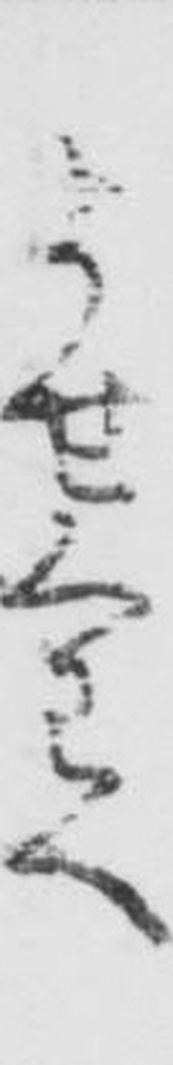よせくわへ
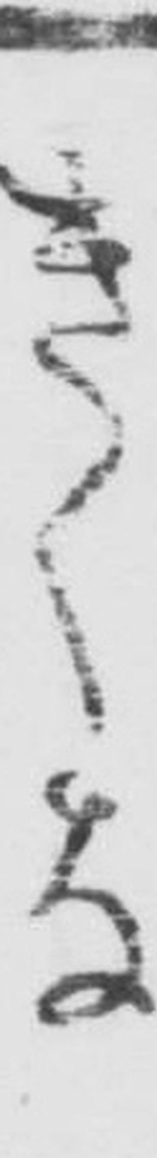きくな
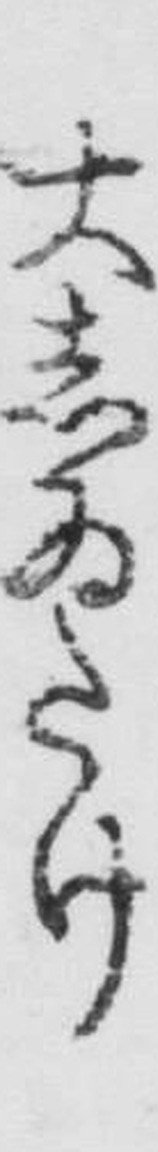大しゐたけ
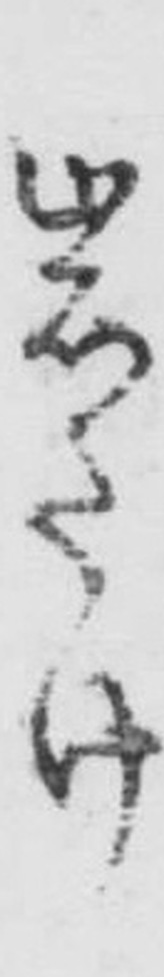岩たけ
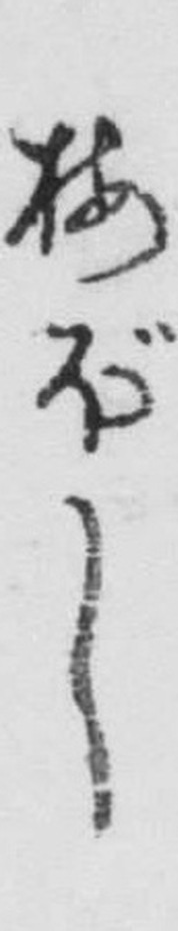梅ぼし
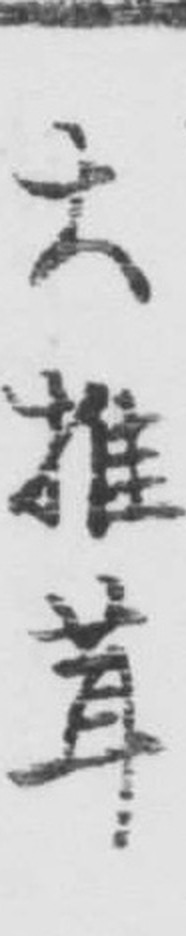大椎茸
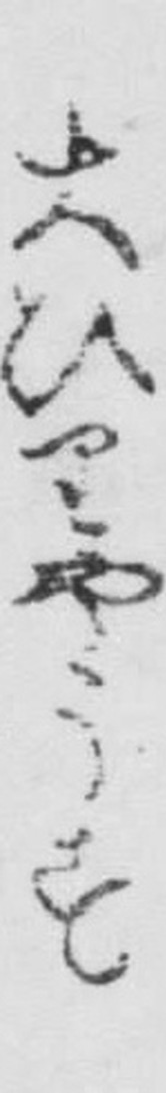大ひりやうす
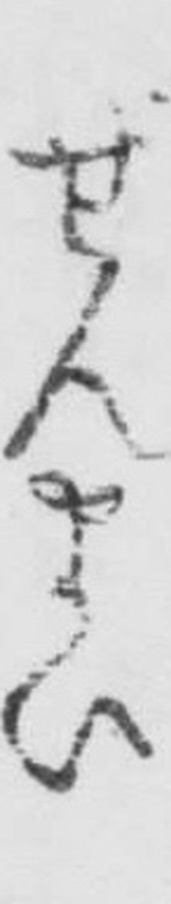ぜんまい
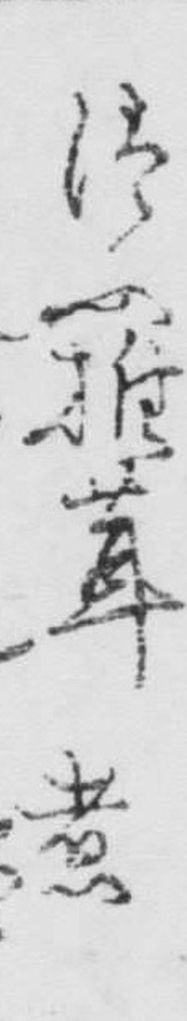つふ椎茸煮
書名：諸家通用/即席料理
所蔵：大阪府立大学学術情報センター 国文学研究資料館
